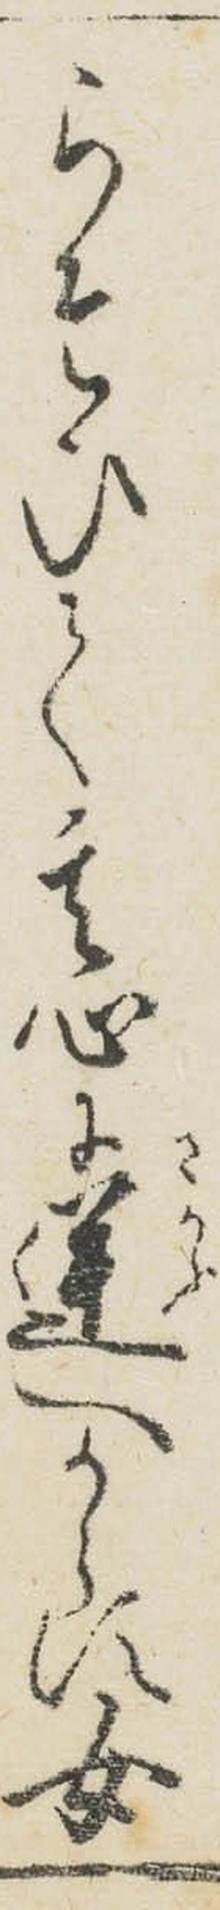らそひて其心に逆へからす女
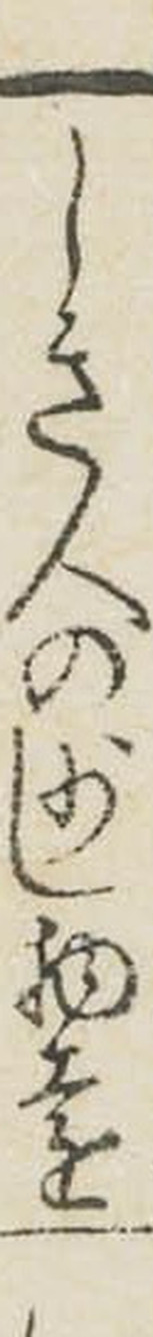しき人の少し物遠
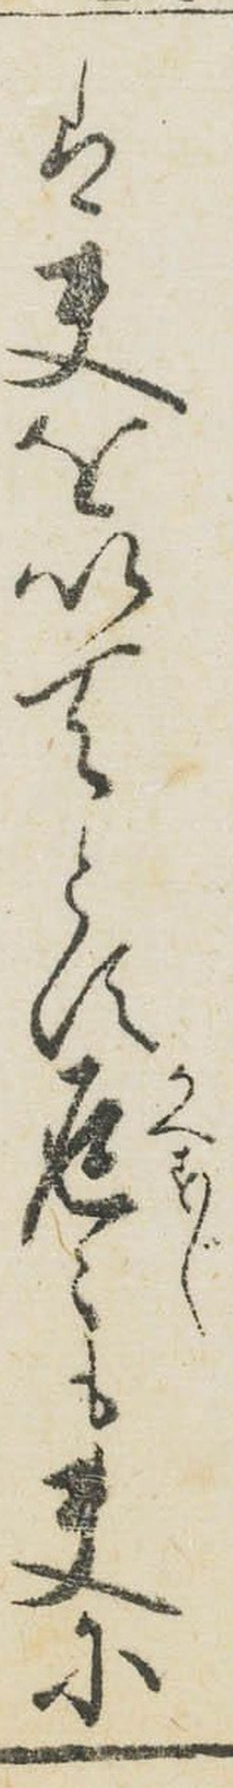は夫を以天とす返々にも夫に
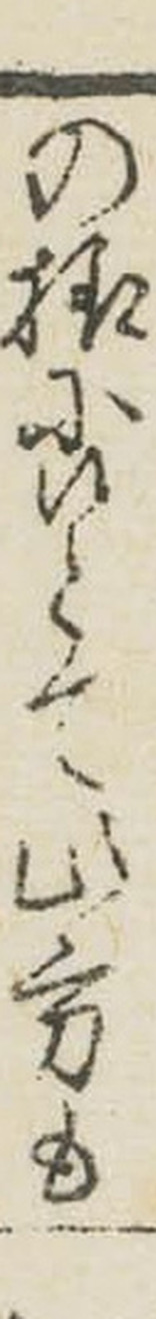の様に候とて此方も
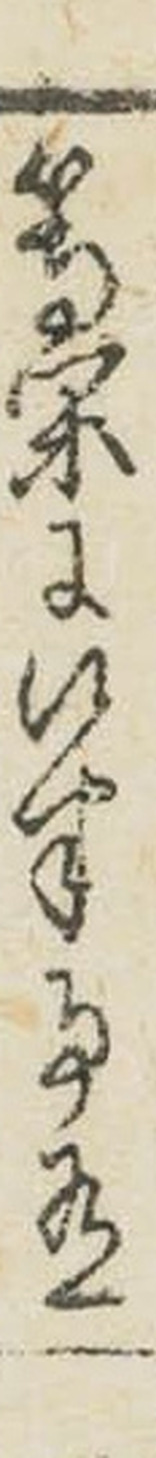等閑に候半事有
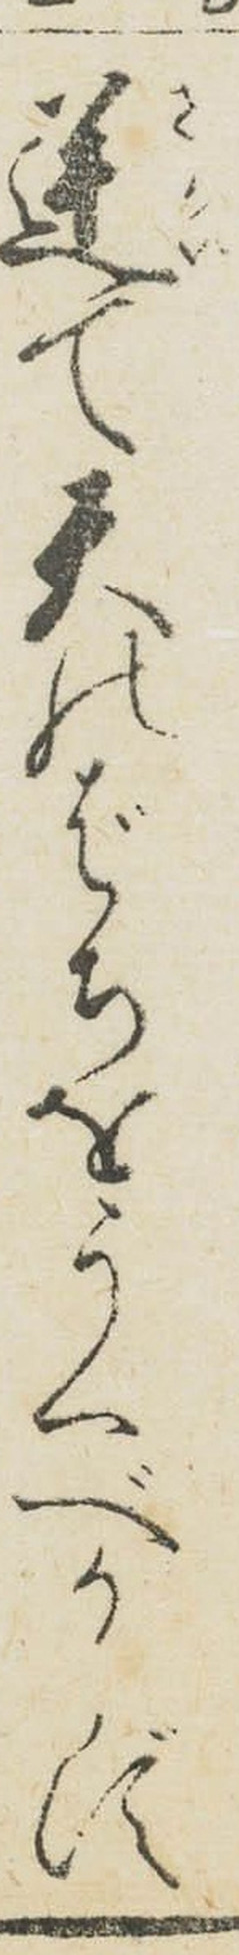逆て天のばちをうくべからず
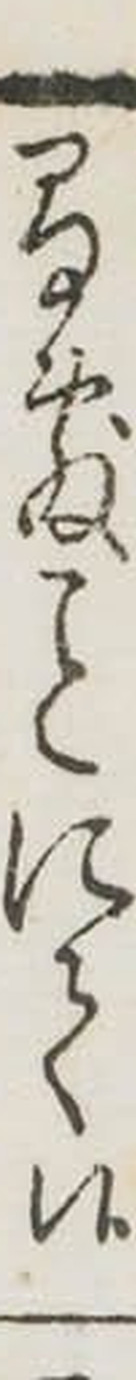間敷ことにて候
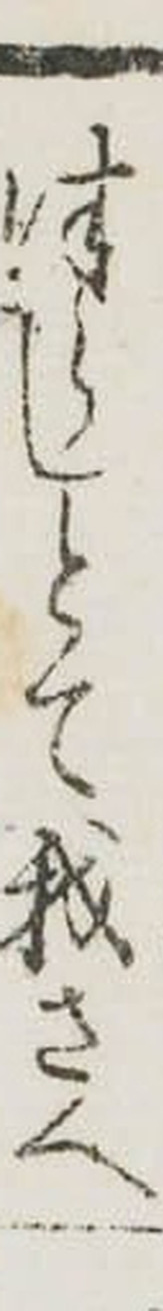つらしとて我さへ
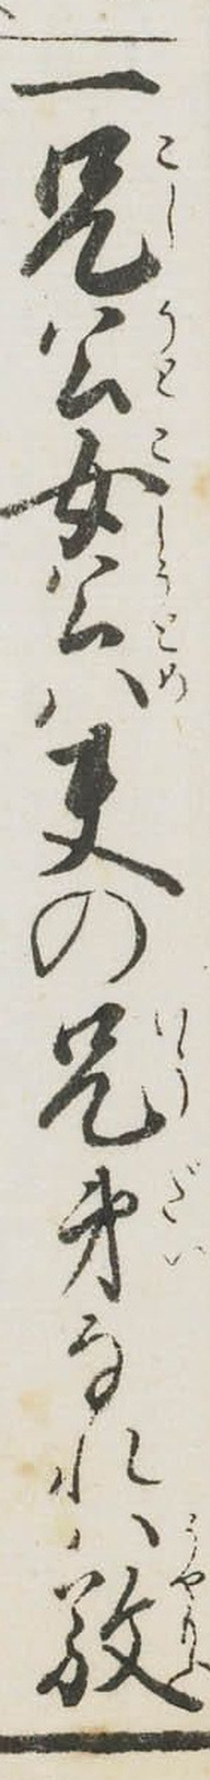一兄公女公は夫の兄弟なれは敬
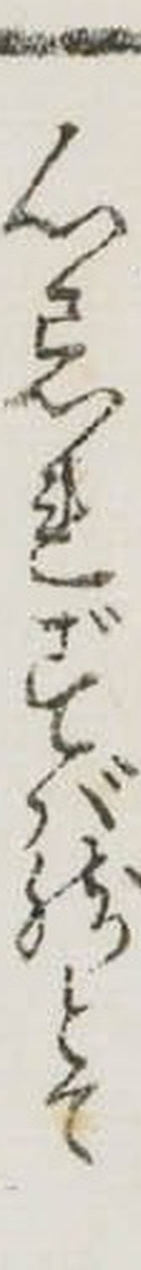心忘れずば然とて
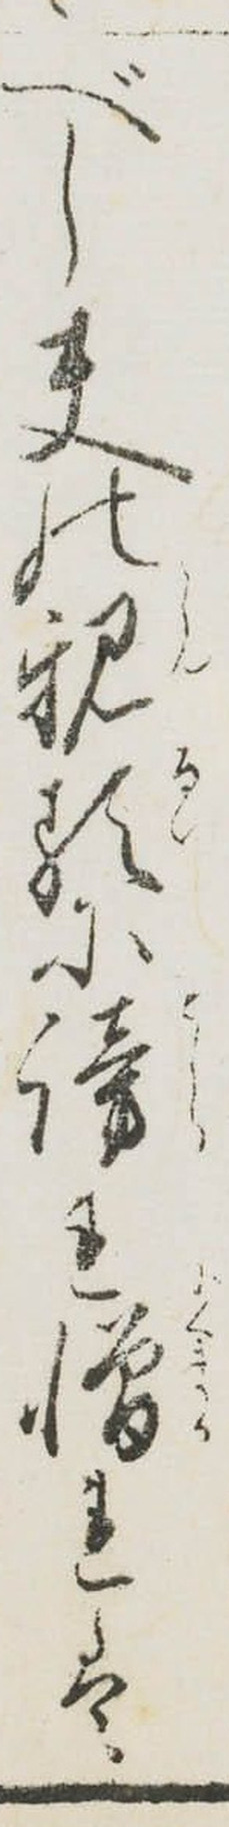べし夫の親類に謗れ憎れは
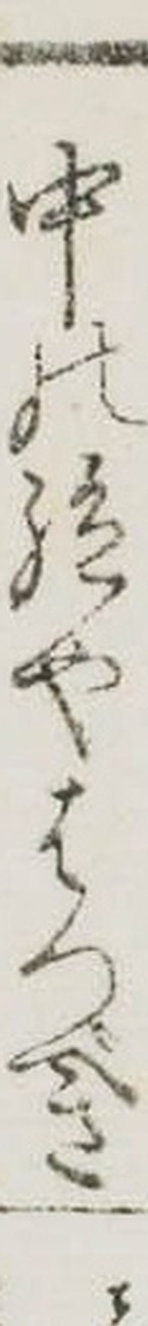中の絶やはつべき
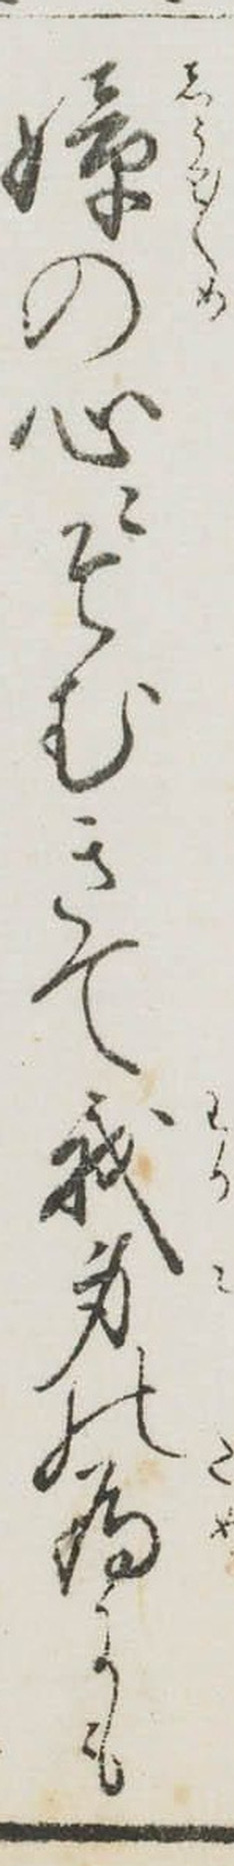嫜の心我身の為にも
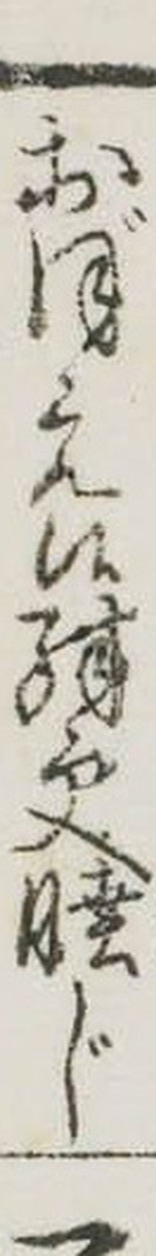おぼえ候殊更睦じ
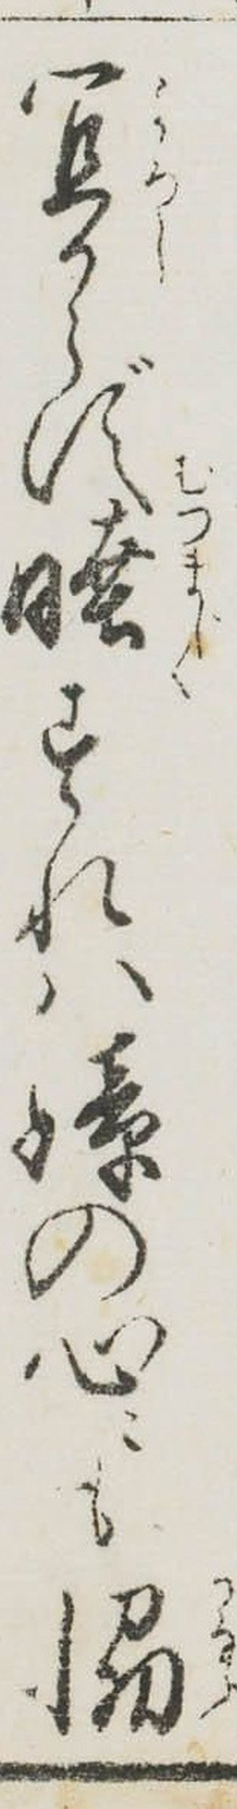宜からず睦すれは嫜の心協
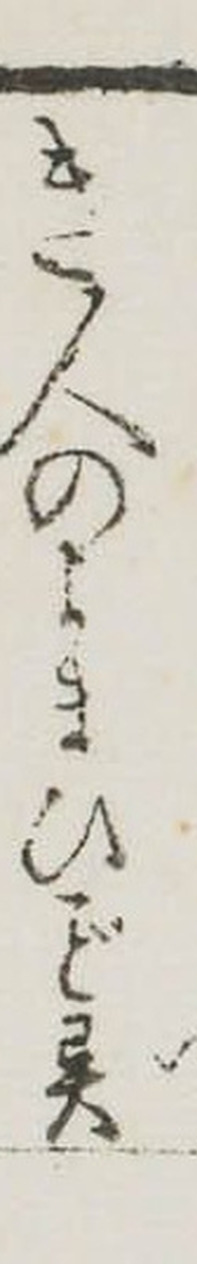き人のよまひごと異
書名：女大学
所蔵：東京学芸大学教育コンテンツアーカイブ
